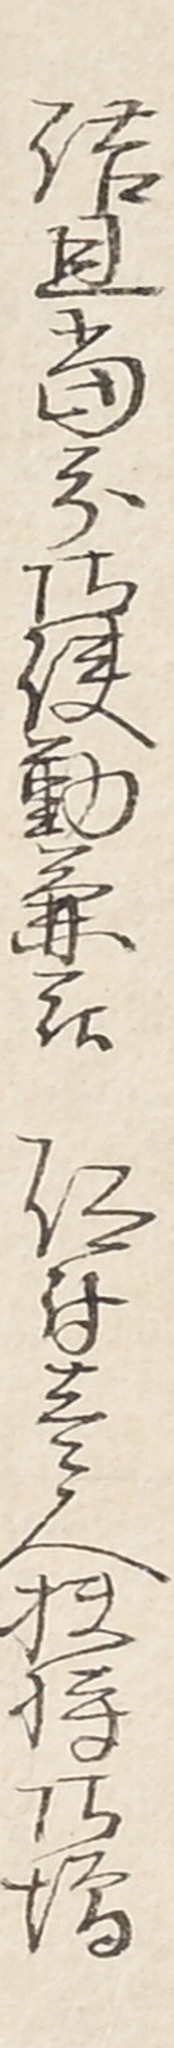詰且御使勤兼被仰付壱人扶持御増
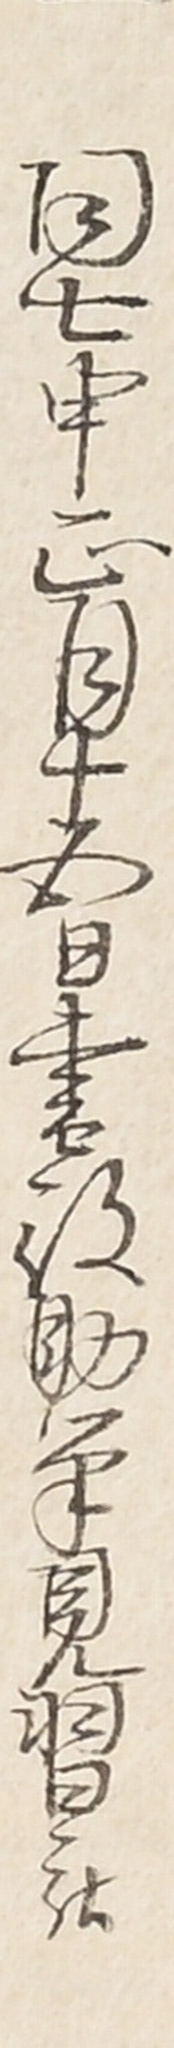一同七申正月十五日書役助筆見習被
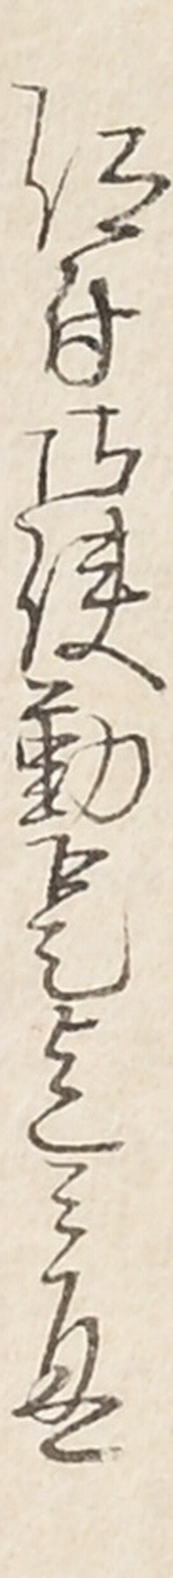仰付御使勤是迄之通
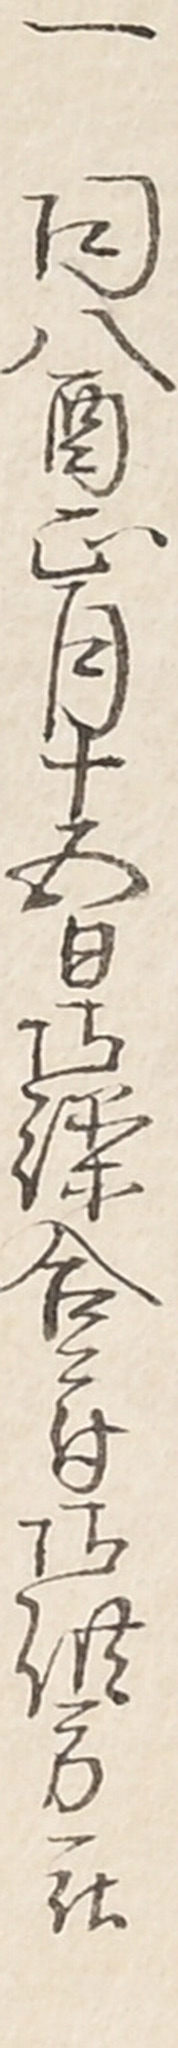一同八酉正月十五日御繰合ニ付御供方被
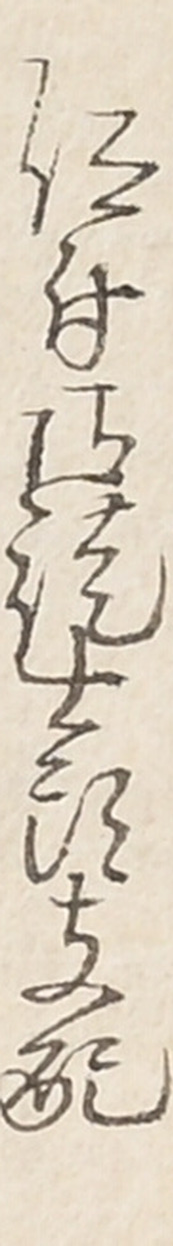仰付御徒士頭支配
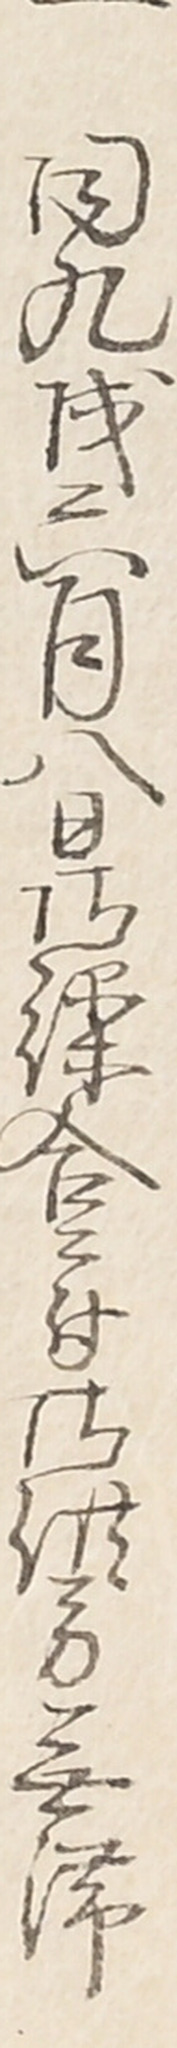一同九戌六月八日御繰合ニ付御供方無滞
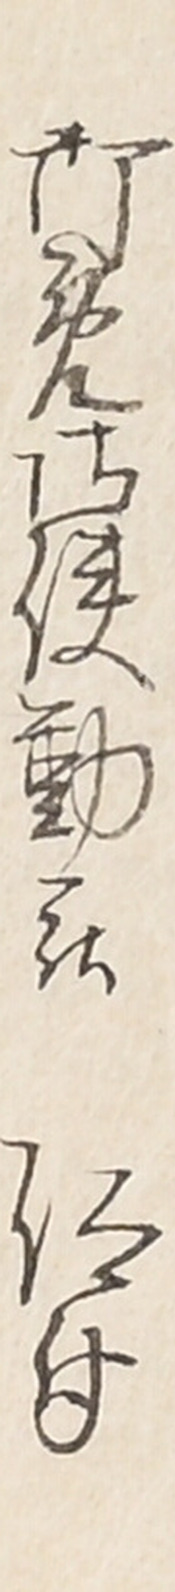御免御使勤被仰付
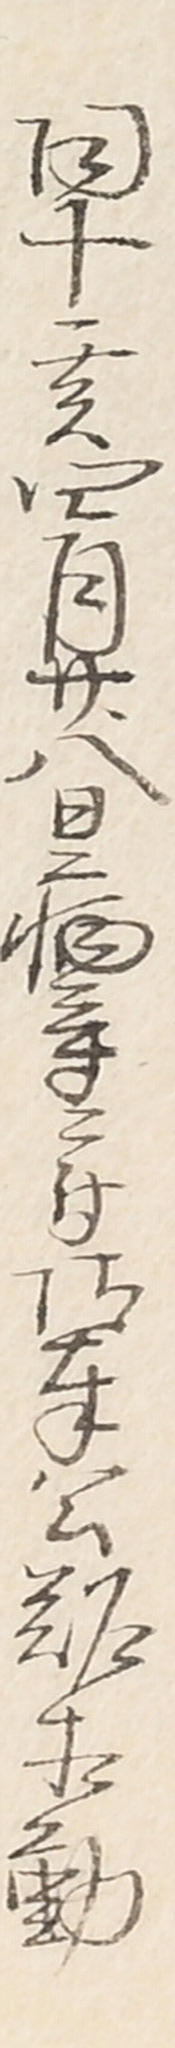一同十亥四月廿八日病気ニ付御奉公難相勤
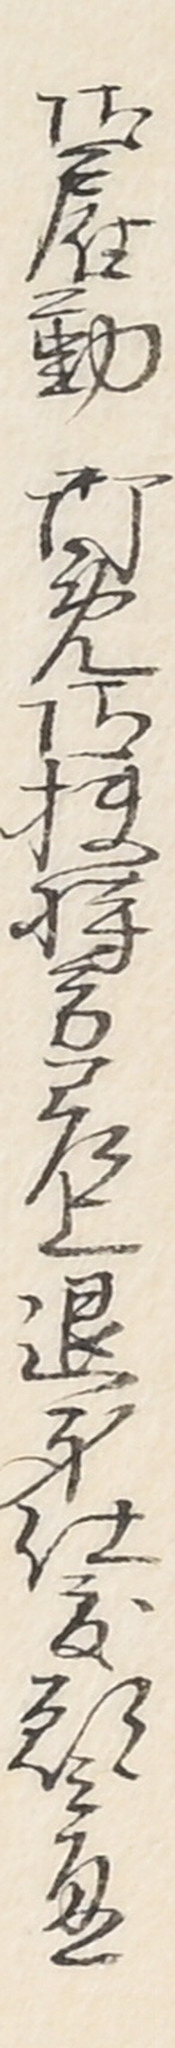御雇勤御免御扶持方差上退身仕度願之通
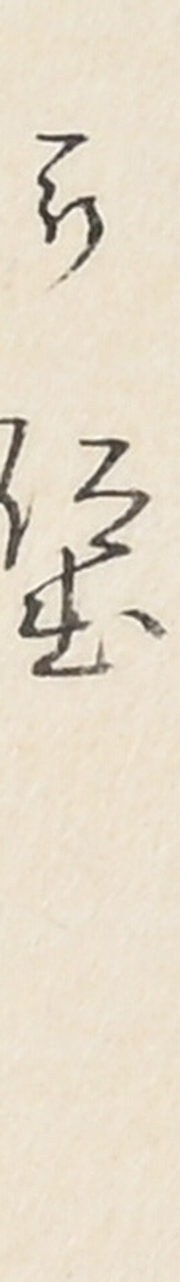被仰出
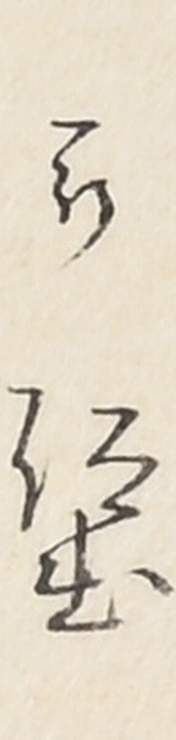被仰出
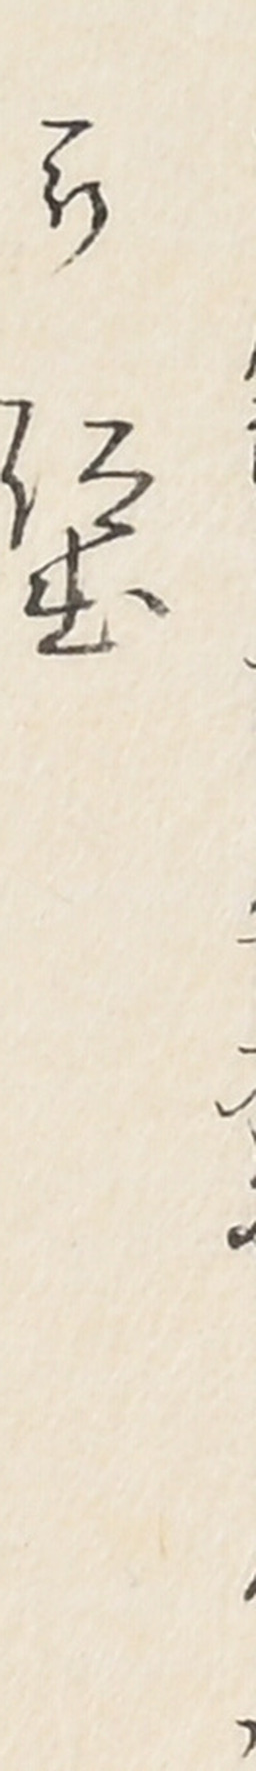被仰出
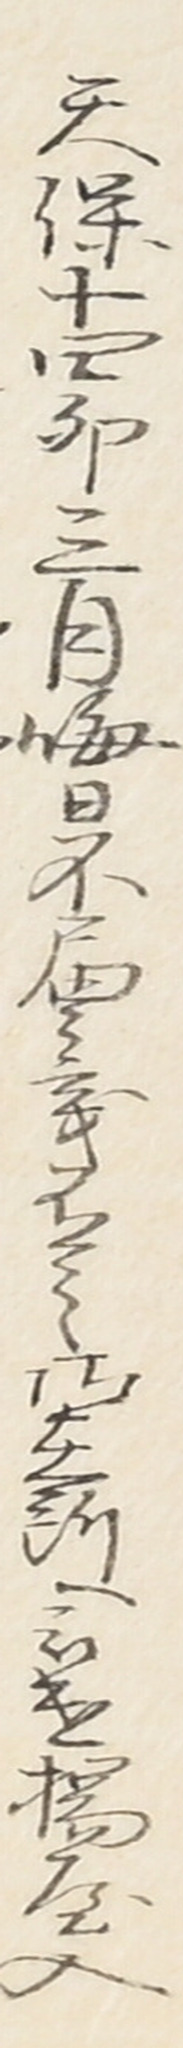一天保十四卯三月晦日不届之義有之御在所へ被遣揚屋入
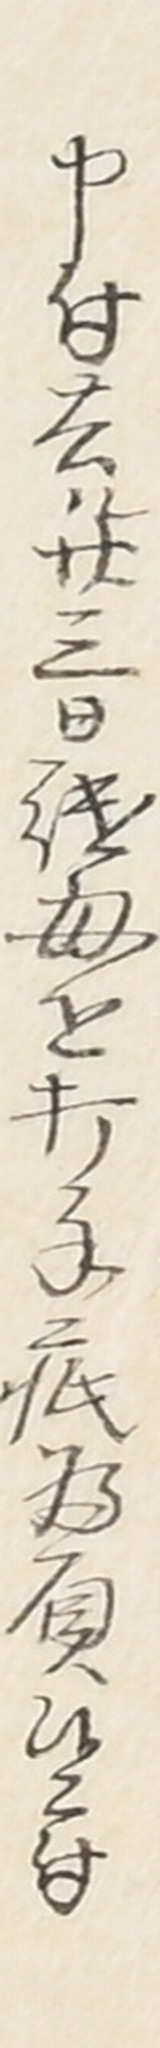申付去ㇽ廿三日継母を打手疵為負候ニ付
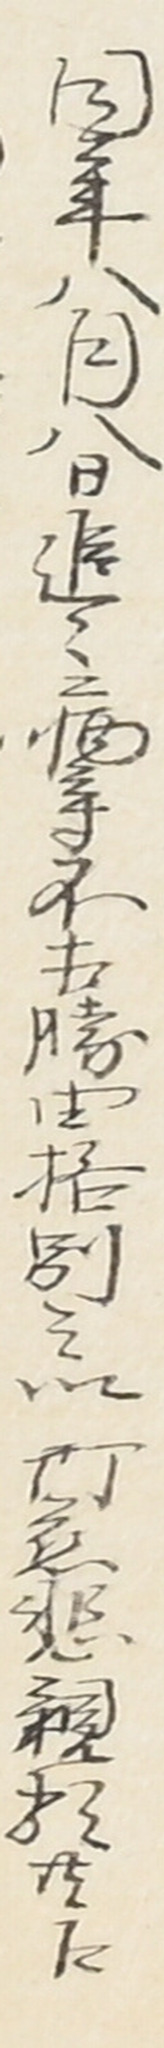一同年八月八日追々病気不相勝由格別之以御慈悲親類共江
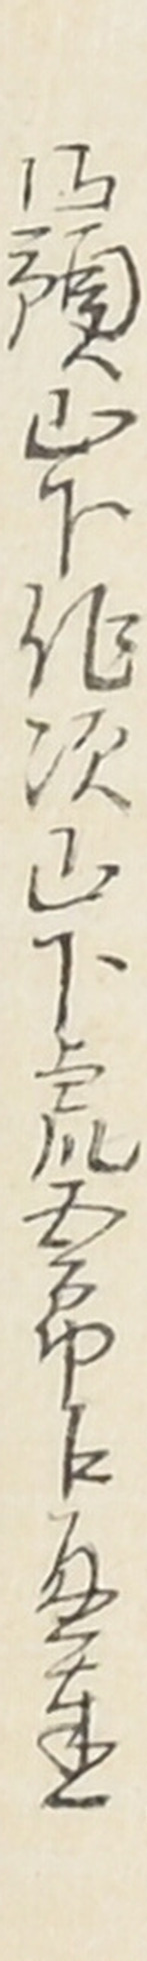御預山下作次山下虎五郎江通達
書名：無足諸士勤仕録（四）
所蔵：伊那市立高遠町図書館・合同会社AMANE
